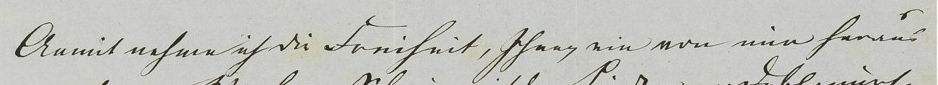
Anmit nehme ich die Freiheit, Ihnen ein von mir heraus-
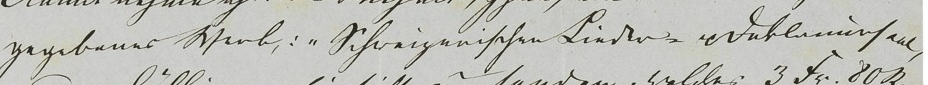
gegebenes Werk: «Schweizerischer Lieder- & Deklamirsaal»,
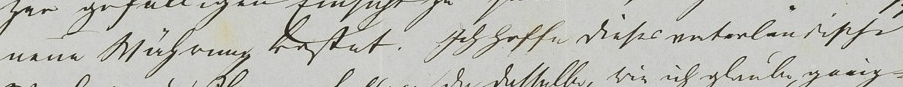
neue Währung kostet. Ich hoffe dieses vaterländische
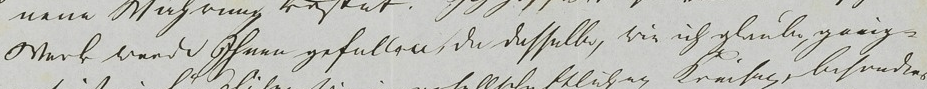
Werk werde Ihnen gefallen, da dasselbe, wie ich glaube, geeig-
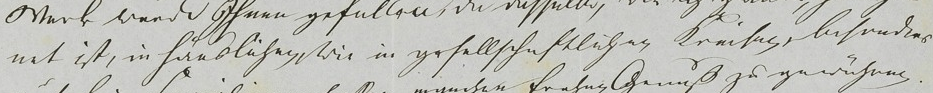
net ist, in häuslichen wie in gesellschaftlichen Kreisen, besonders
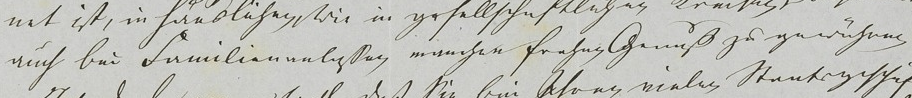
auch bei Familienanlassen manchen frohen Genuß zu gewähren.
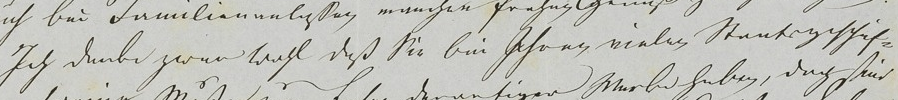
Ich denke zwar wohl daß Sie bei Ihren vielen Staatsgeschäf-
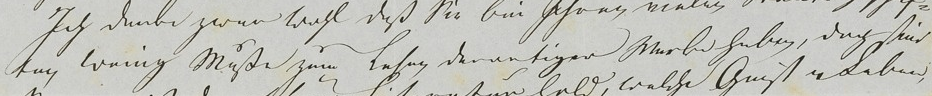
ten wenig Muße zum Lesen derartiger Werke haben, doch sind
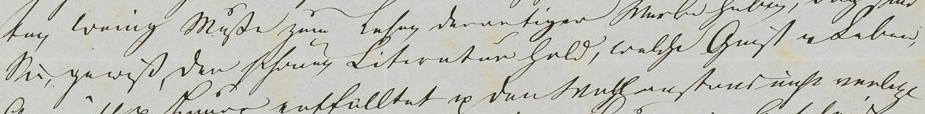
Sie, gewiß, der schönen Literatur hold, welche Geist & Leben,
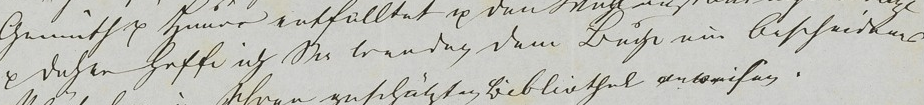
& daher hoffe ich Sie werden dem Buche ein bescheidenes
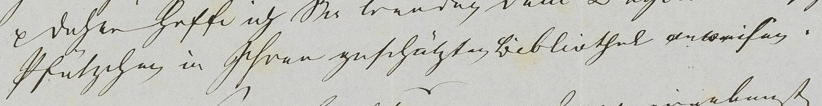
Plätzchen in Ihrer geschätzen Bibliothek anweisen.
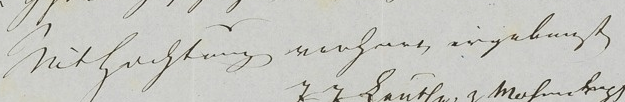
Mit Hochtung verharre ergebenst
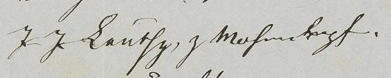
J. J. Leuthy, z Mohrenkopf.
